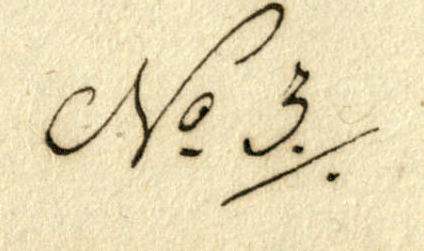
No 3 ./.
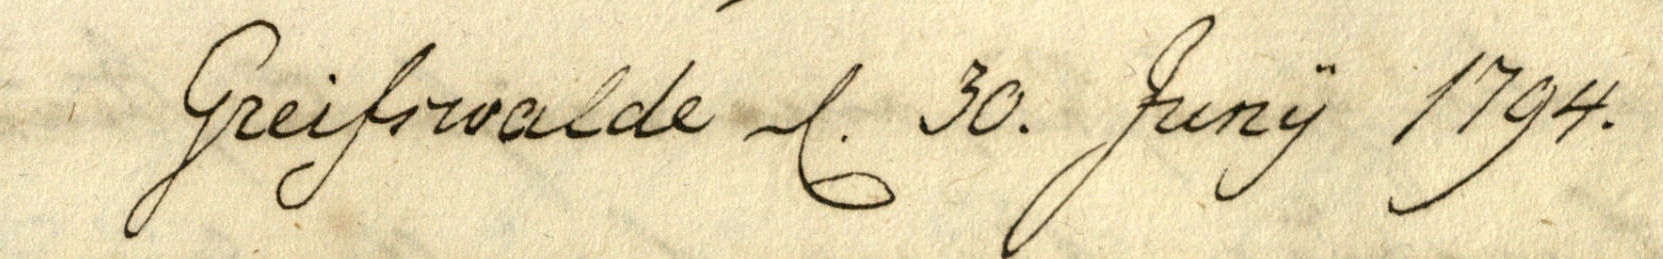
Greifswalde d. 30. Juny 1794.
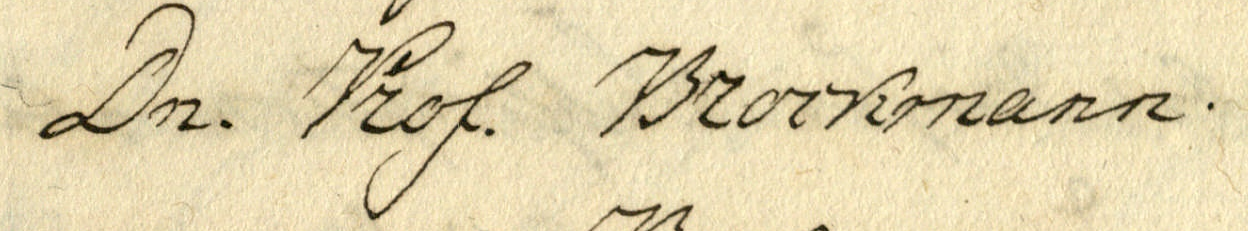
Dn. Prof. Brockmann
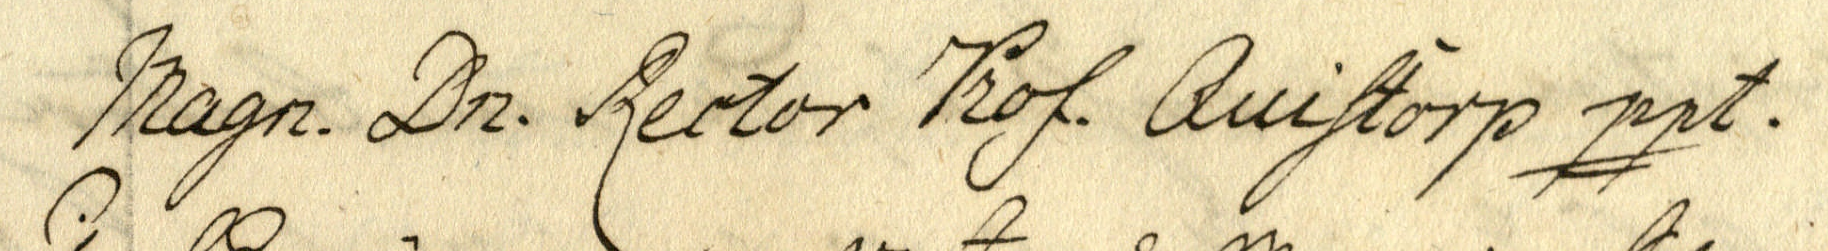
Magn. Dn. Rector Prof. Quistorp ppt.
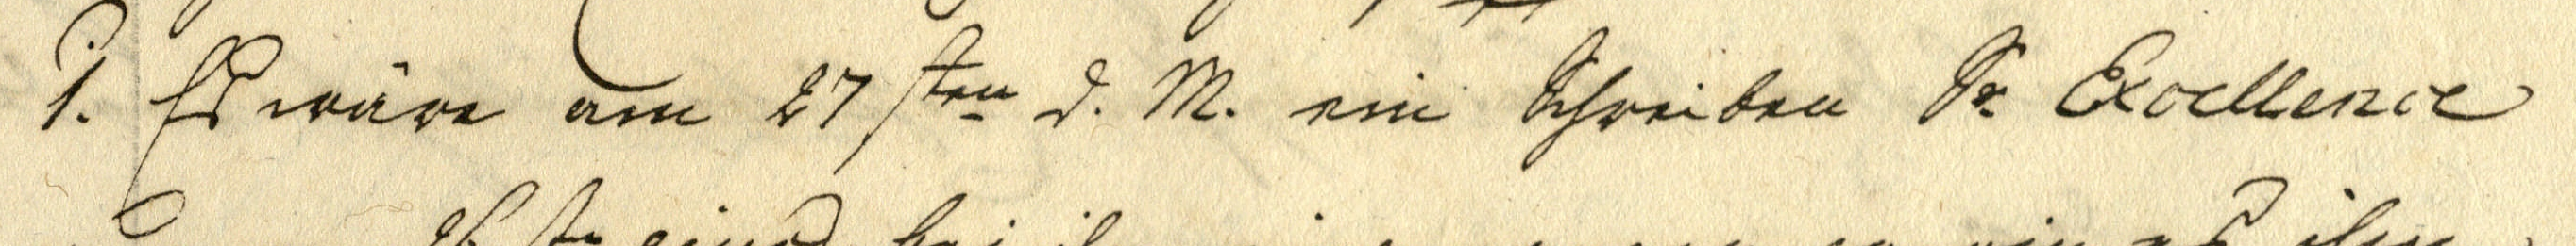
1. Es wäre am 27sten d. M. ein Schreiben Sr. Excellence
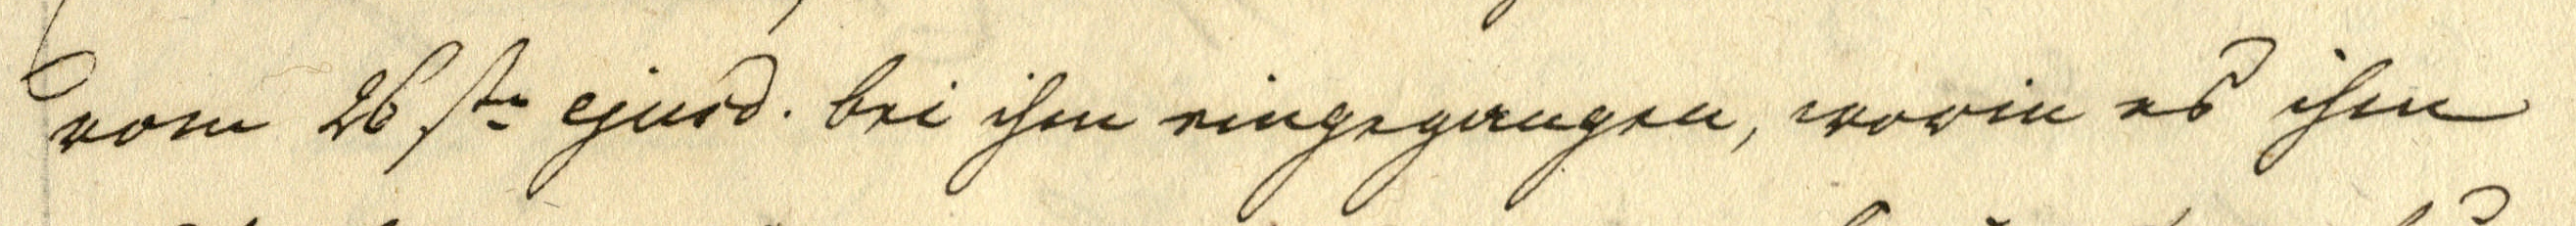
vom 26sten ejusd. bei ihm eingegangen, worin es ihm
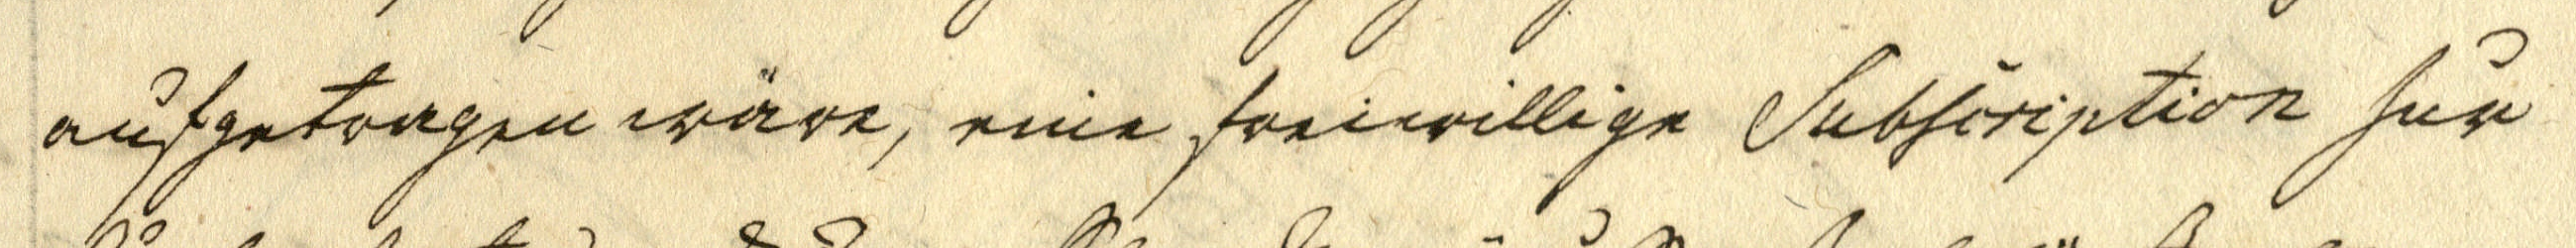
aufgetragen wäre, eine freiwillige Subscription zur
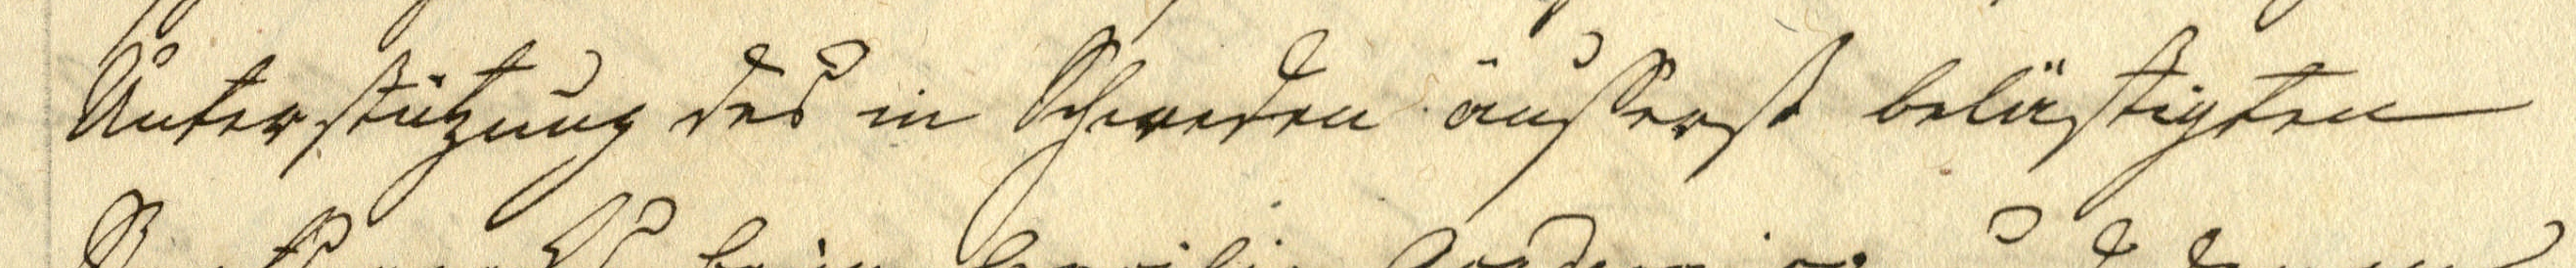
Unterstützung des in Schweden äusserst belästigten
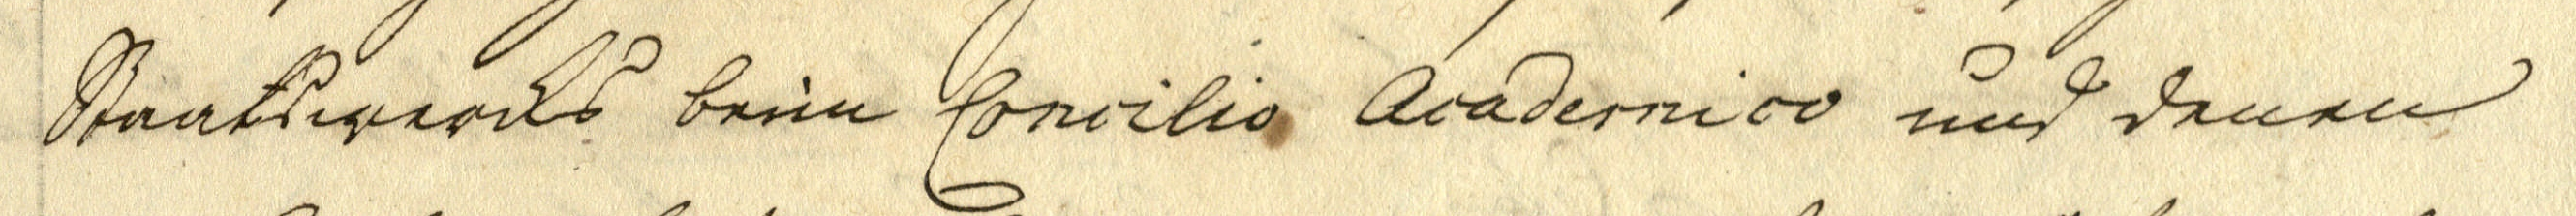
Staatswerks beim Concilio Academico und denen
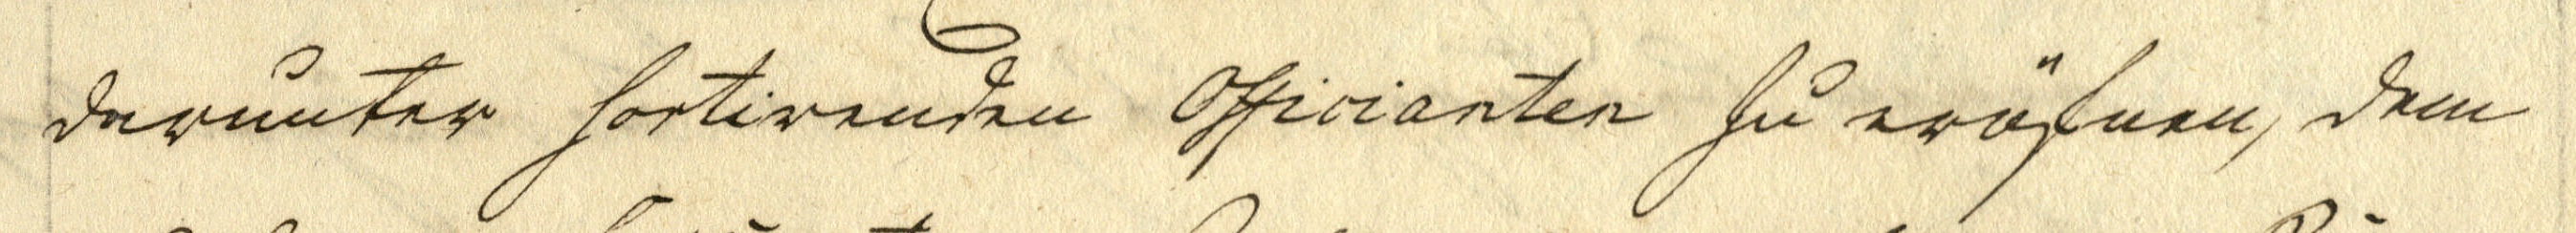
darunter sortirenden Officianten zu eröfnen, dem
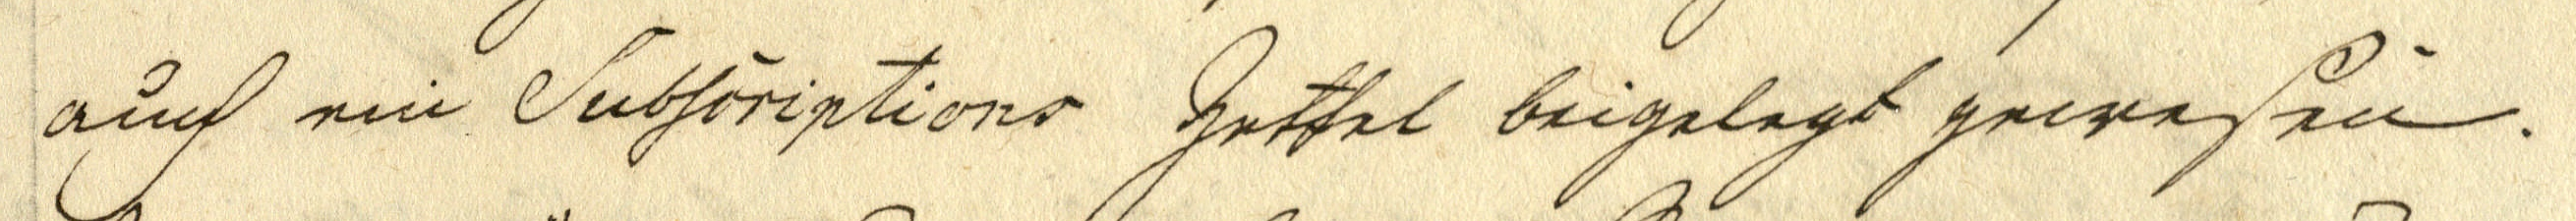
auch ein Subscriptions Zettel beigelegt gewesen.
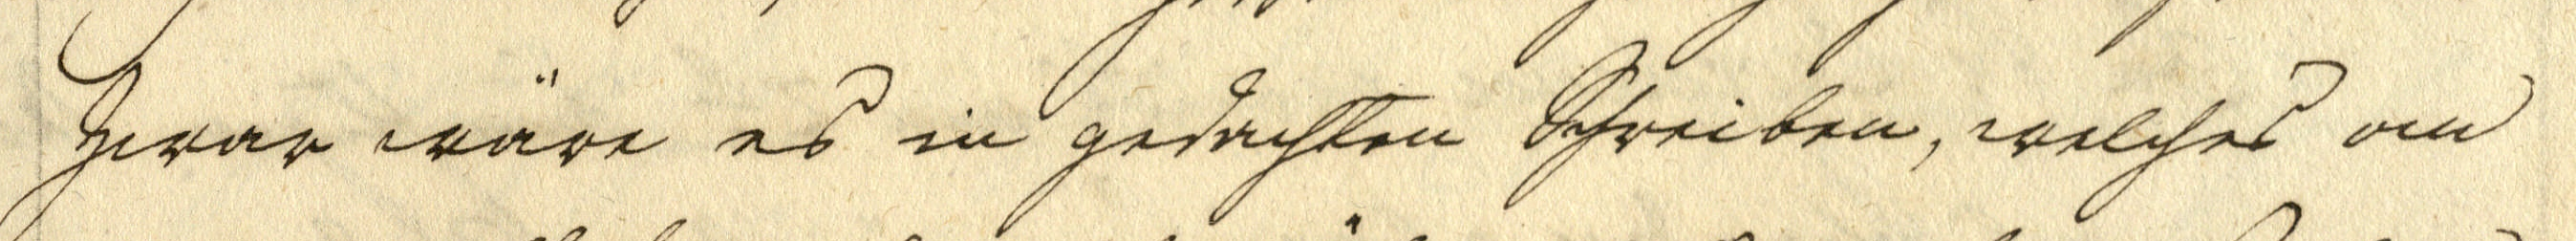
Zwar wäre es in gedachten Schreiben, welches an
